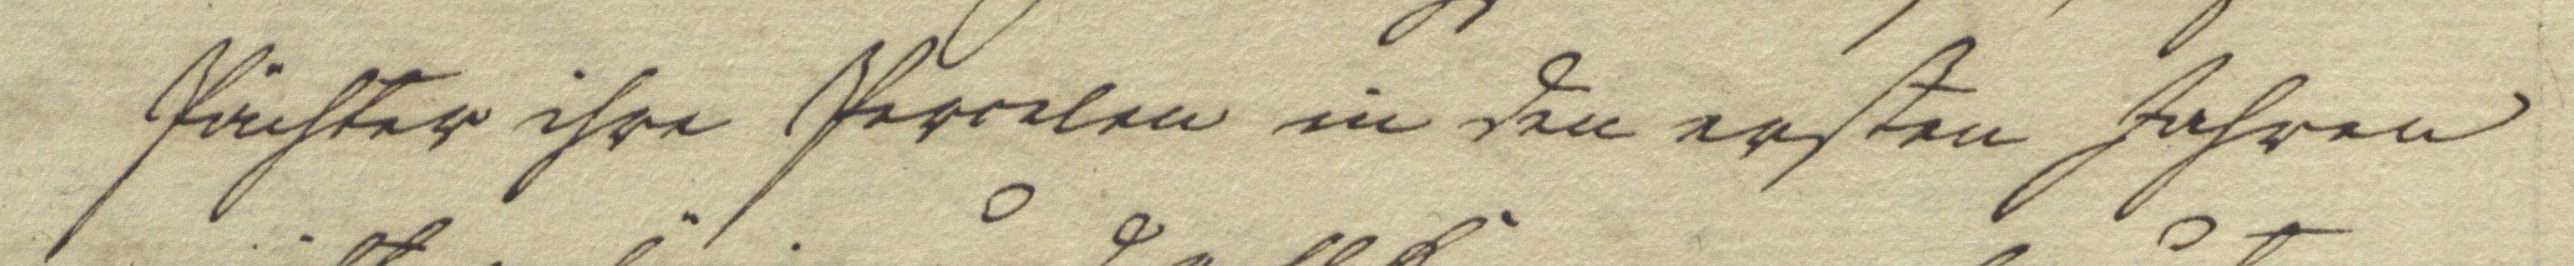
Pächter ihre Parcelen in den ersten Jahren
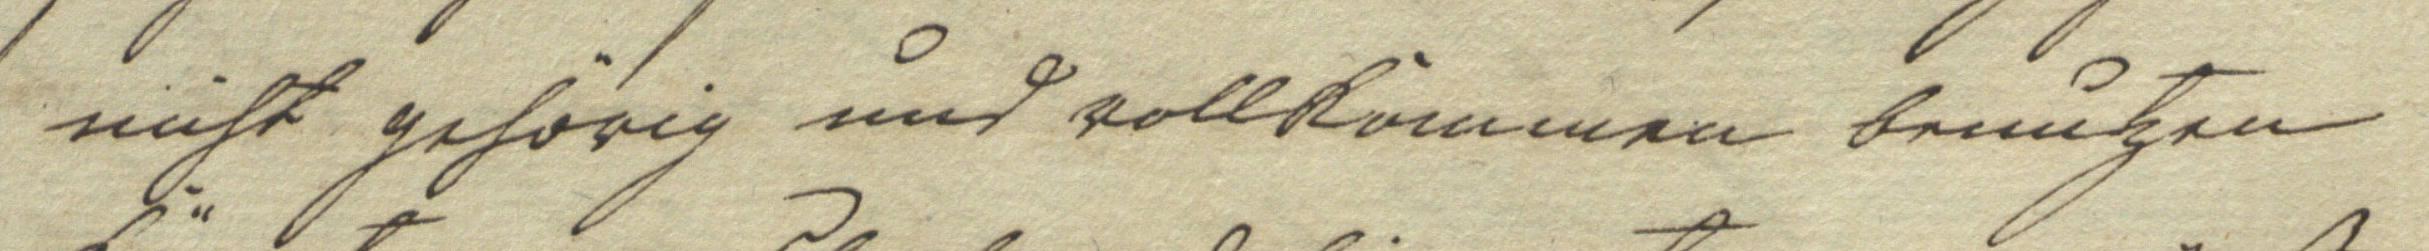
nicht gehörig und vollkommen benutzen
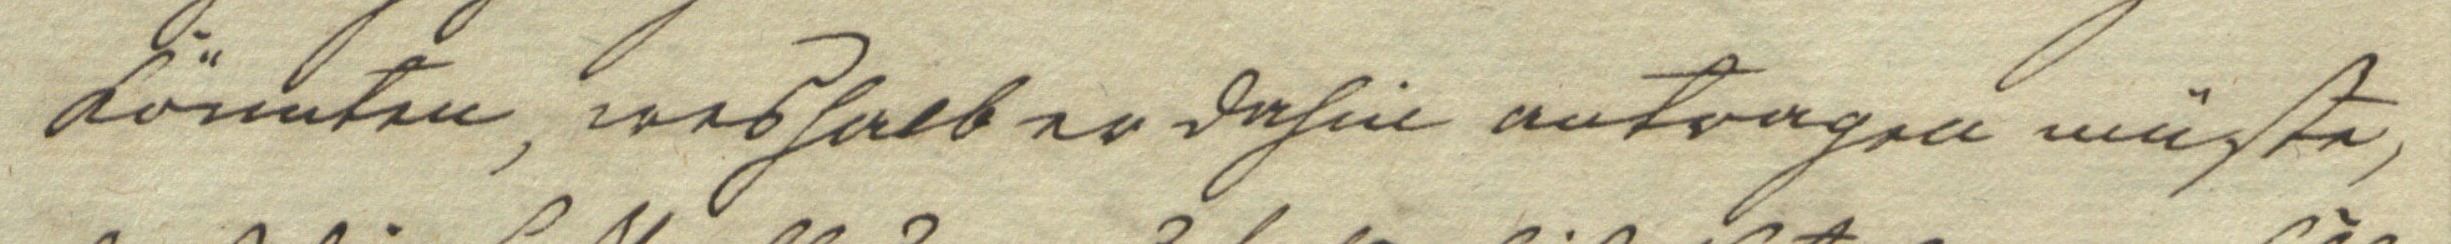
könnten, weshalb er dahin antragen müßte,
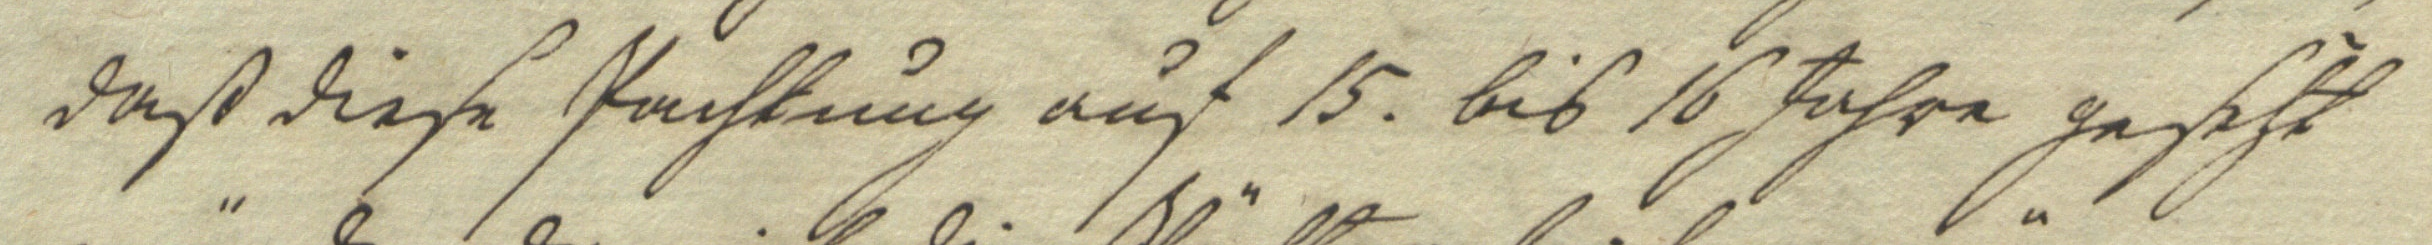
daß diese Pachtung auf 15. bis 16 Jahre gesetzt
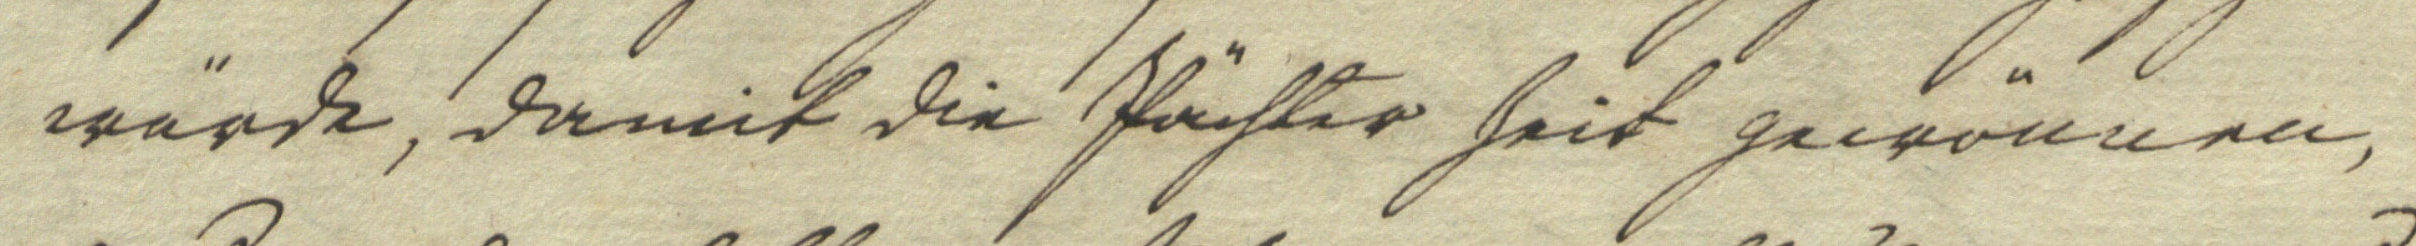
würde, damit die Pächter Zeit gewönnen,
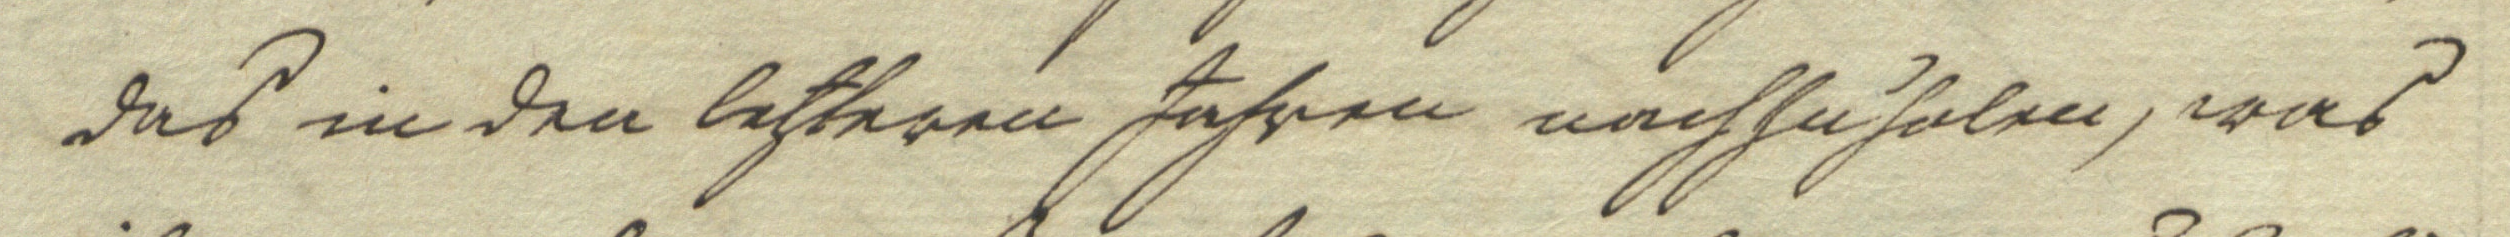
das in den letzteren Jahren nachzuholen, was
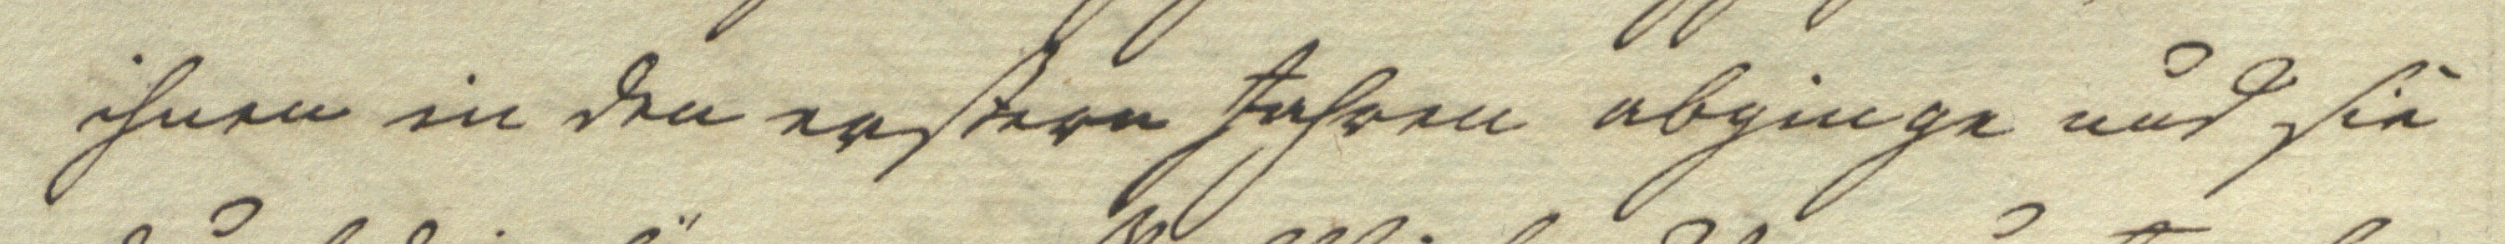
ihnen in den ersten Jahren abginge und sie
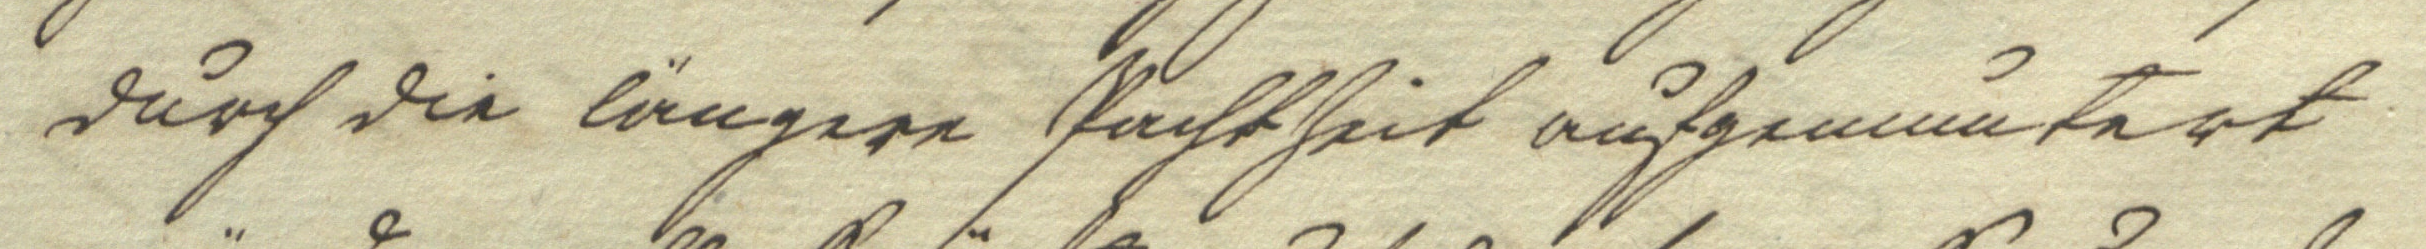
durch die längere Pachtzeit aufgemuntert
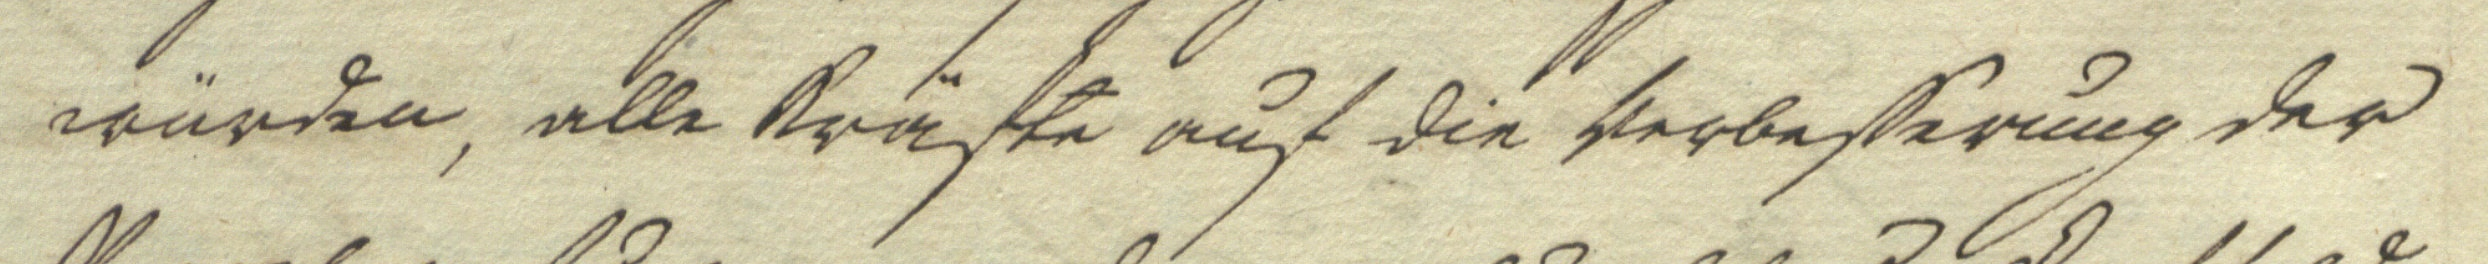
würden, alle Kräfte auf die Verbesserung der
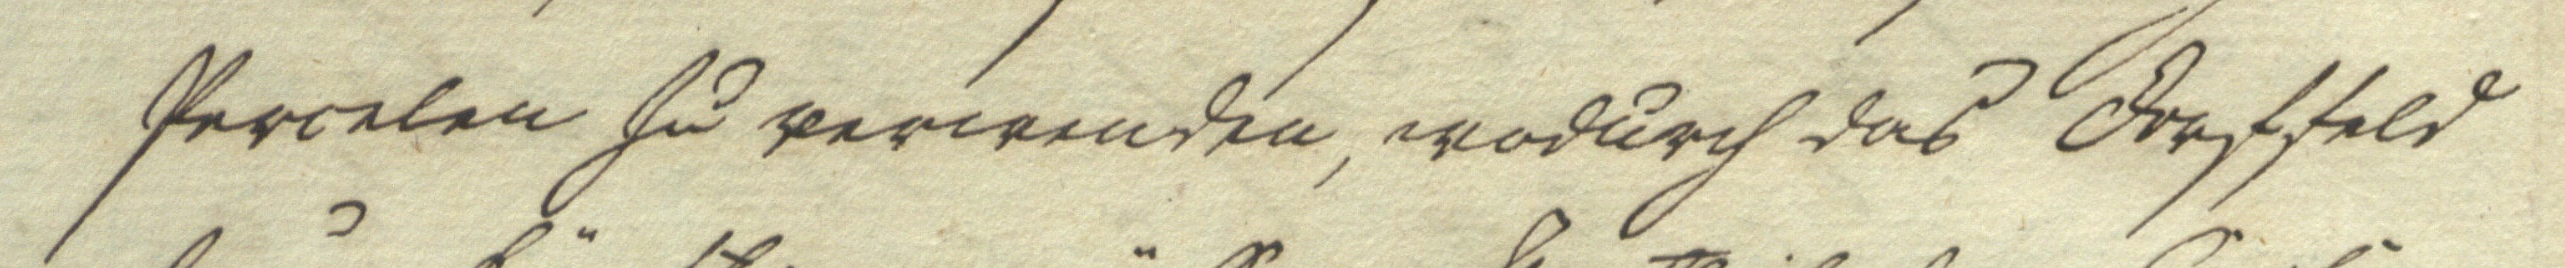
Parcelen zu verwenden, wodurch das Dorffeld
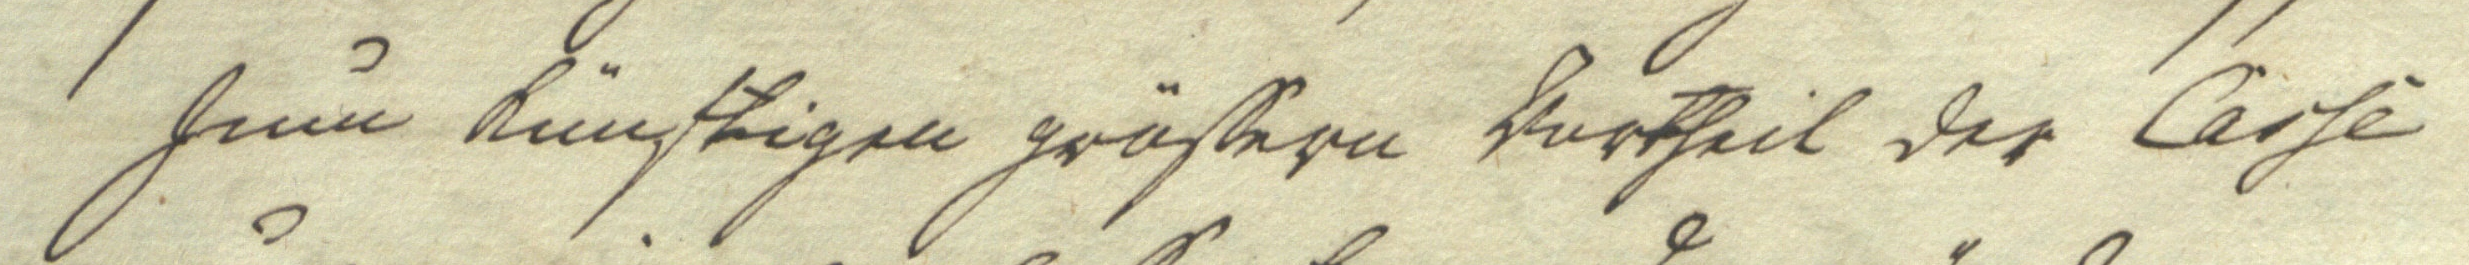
zum künftigen grössern Vortheil der Casse
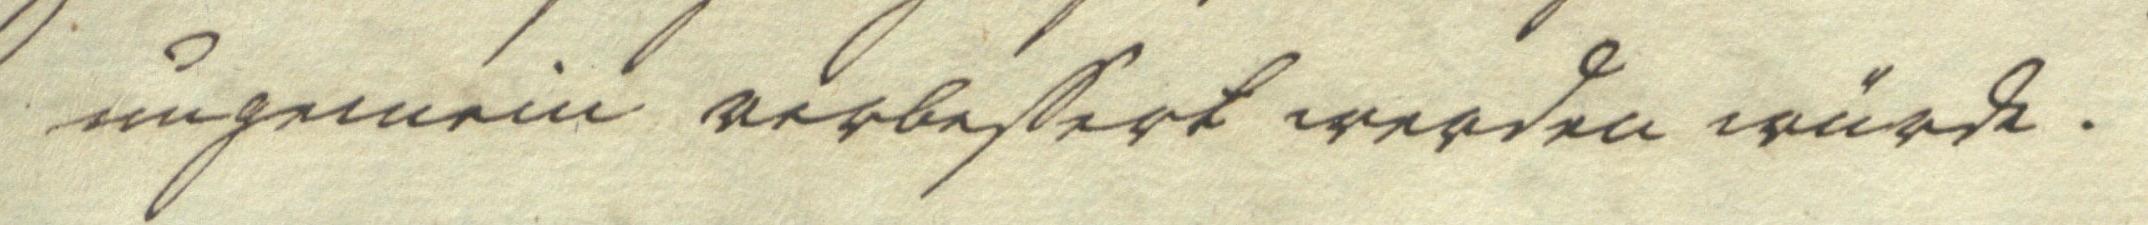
ungemein verbessert werden würde.
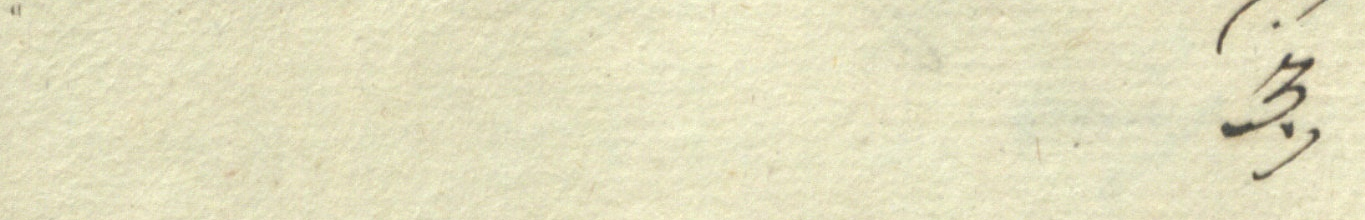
3.,
